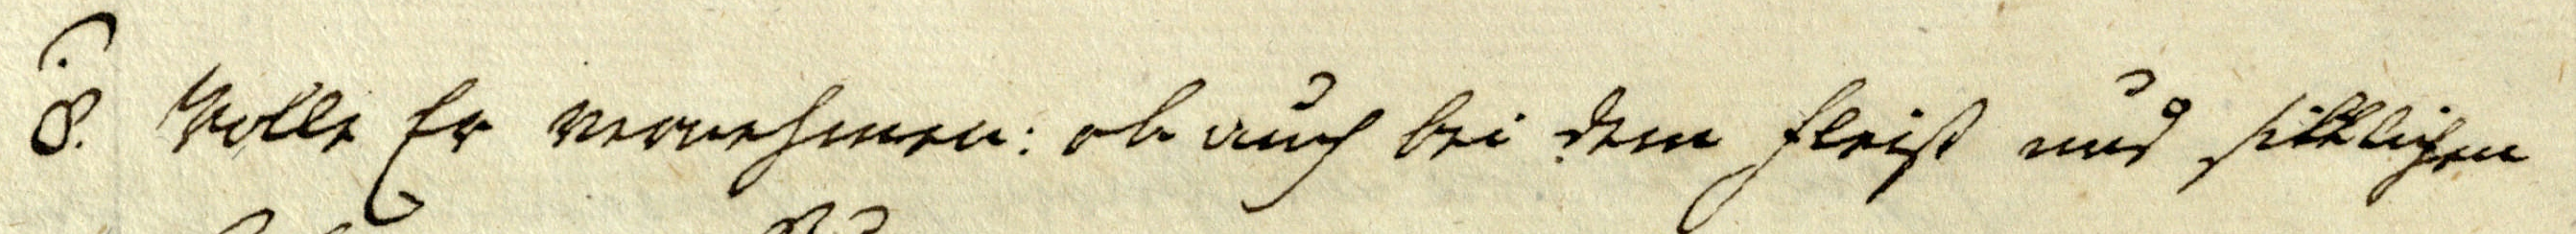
8. Wolle Er vernehmen: ob auch bei dem Fleiß und sittlichen
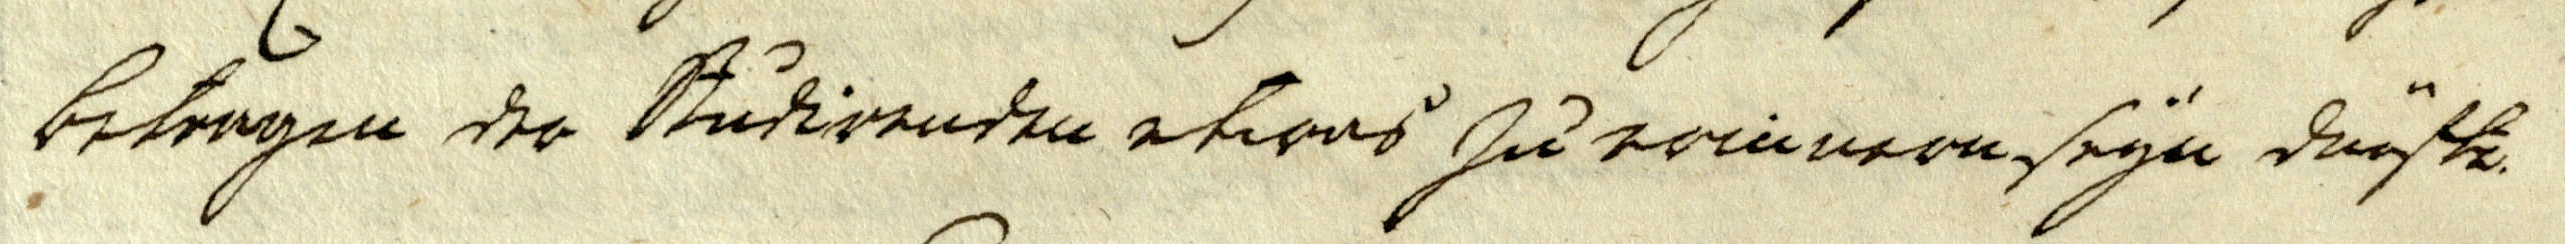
Betragen der Studirenden etwas zu erinnern seÿn dürfte.
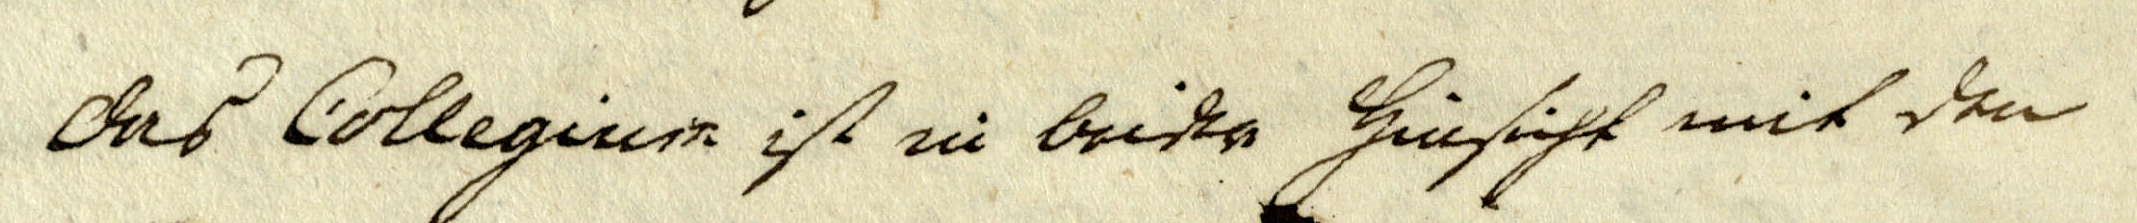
Das Collegium ist in beider Hinsicht mit den
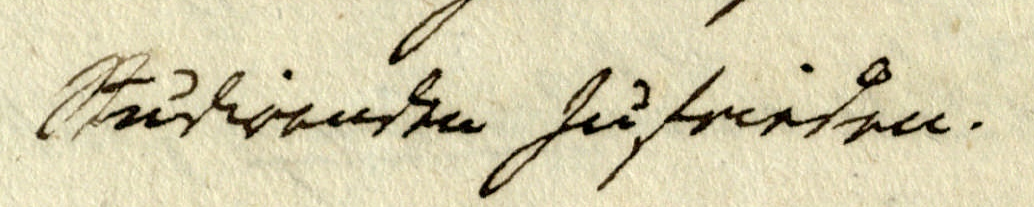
Studirenden zufrieden.
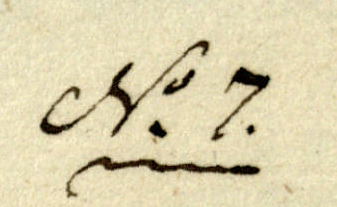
Nº 7.
